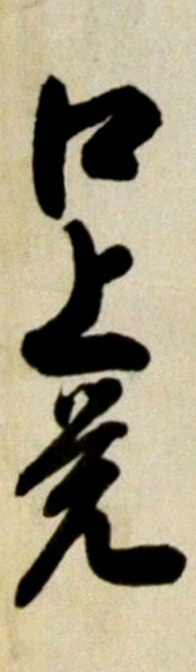口上覚
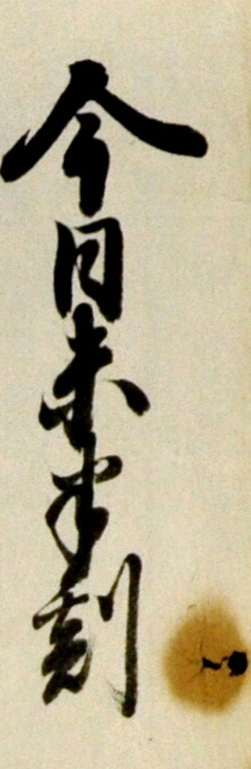今日未半刻
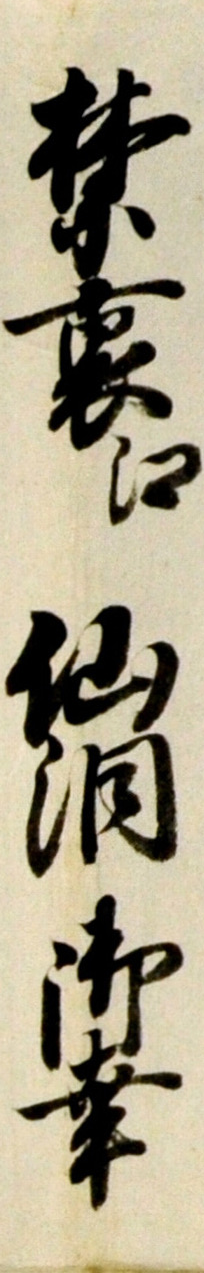禁裏江仙洞御幸
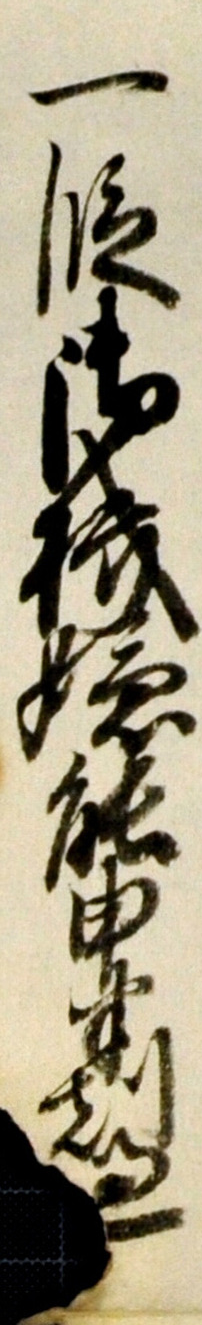一段御機嫌能申半刻過
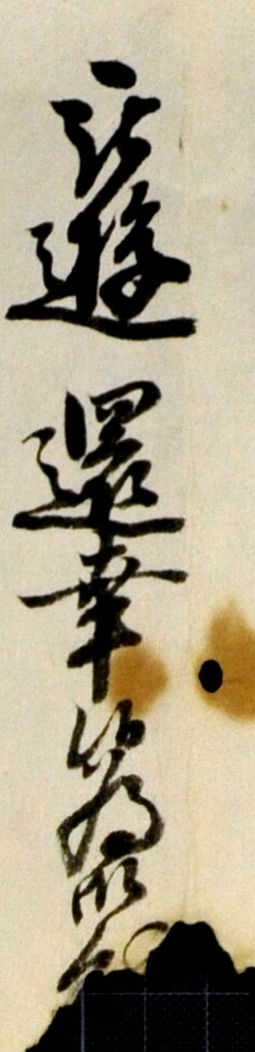被遊還幸候為御
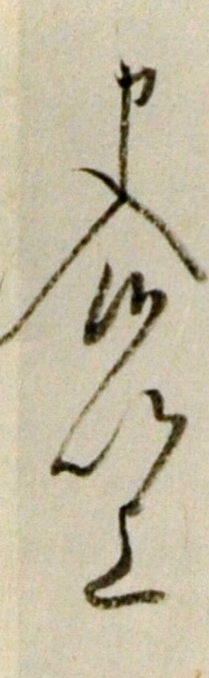申入候以上
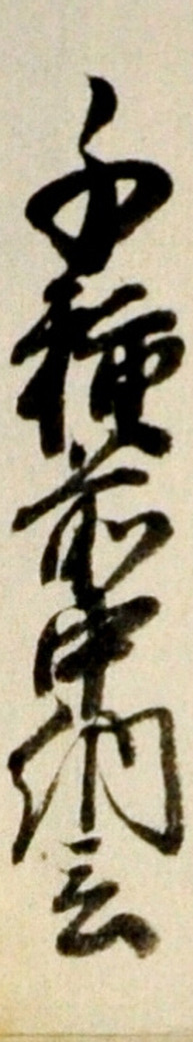千種前中納言
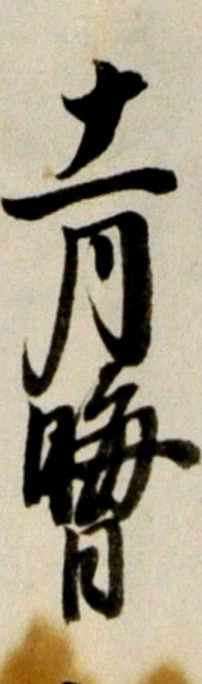十一月晦日
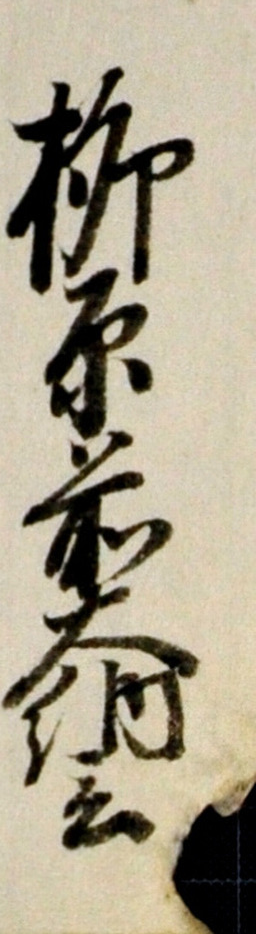柳原前大納言
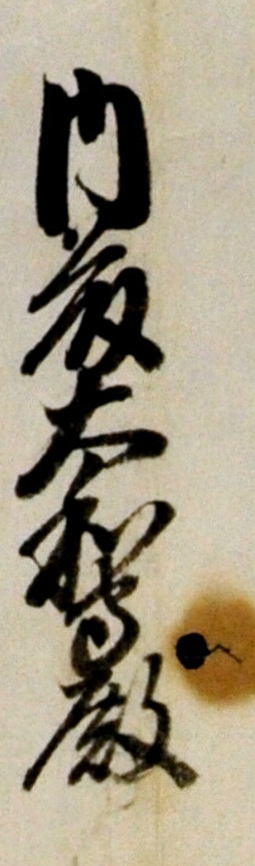内藤大和守殿
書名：口上覚
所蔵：伊那市立高遠町図書館・合同会社AMANE
